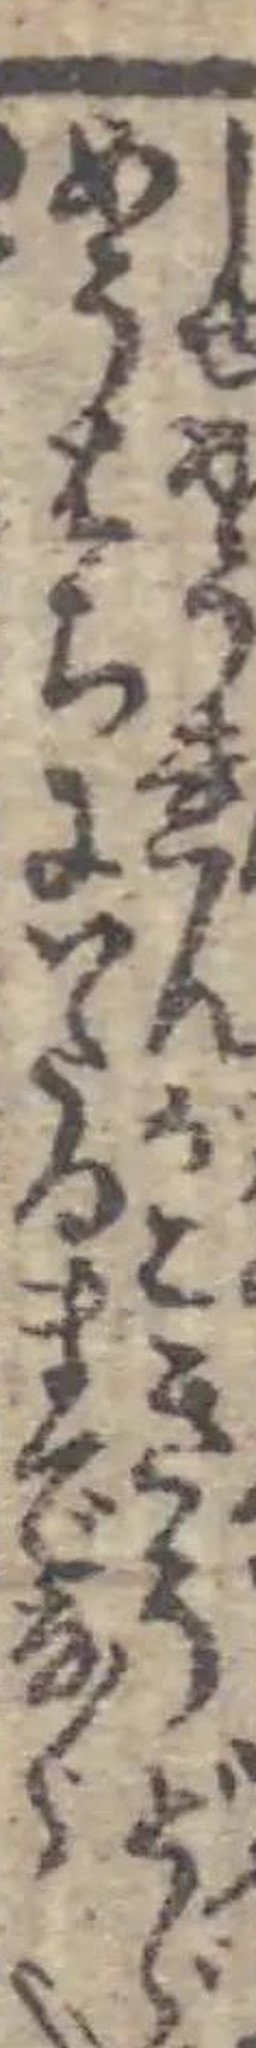めうはちにいたるまでなら
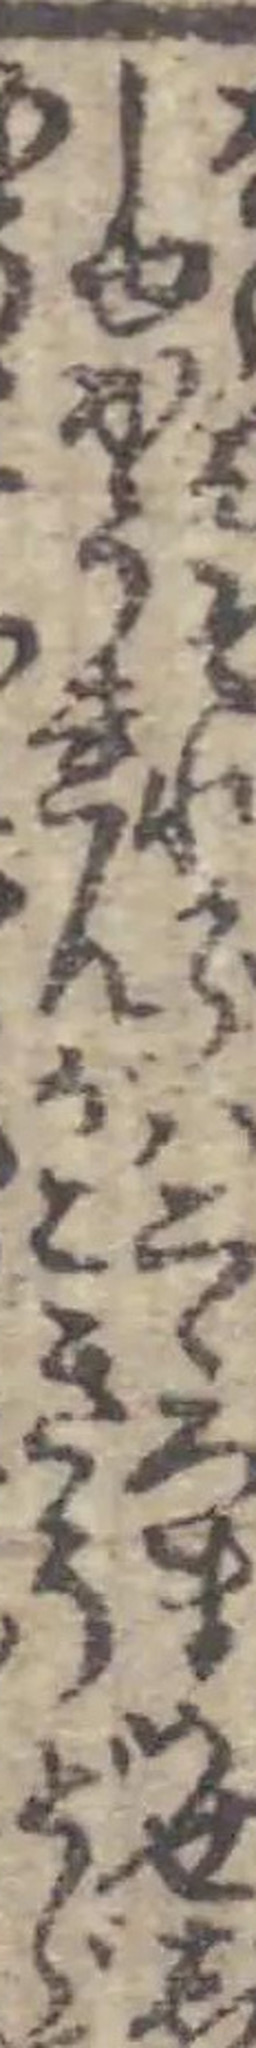しゆかうれんがこきうどら
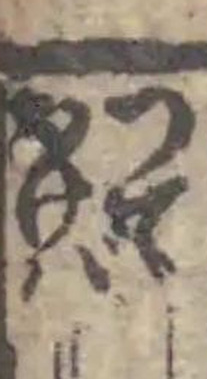おけば
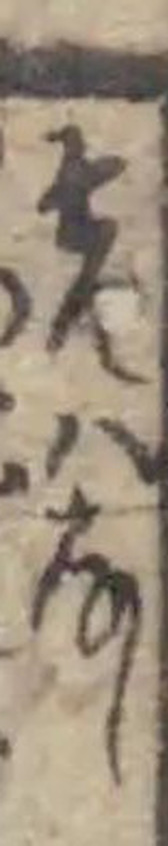そんはなし
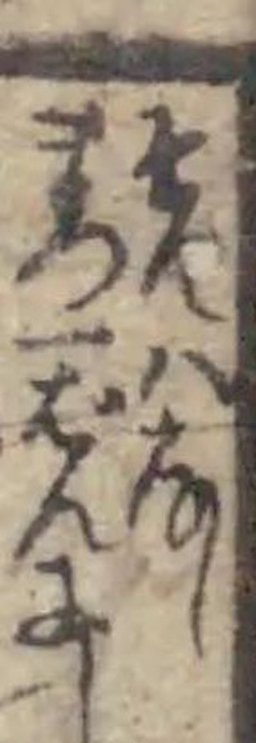まつ一ばんに
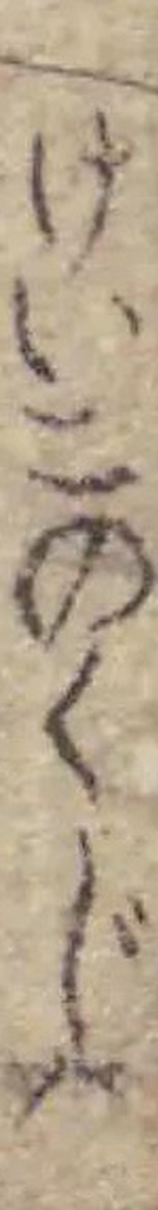けいこのくじ
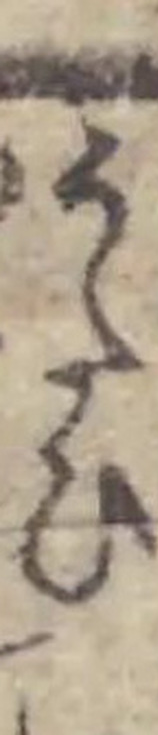うたひ
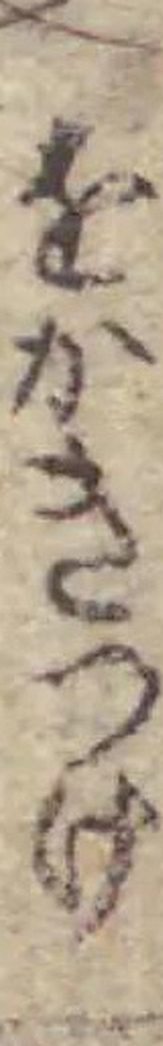をかきつけ
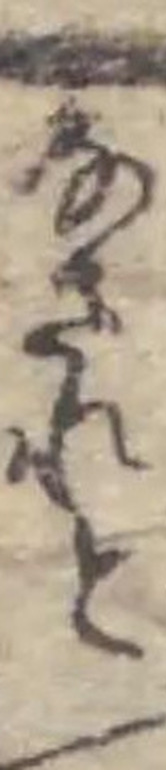なされと

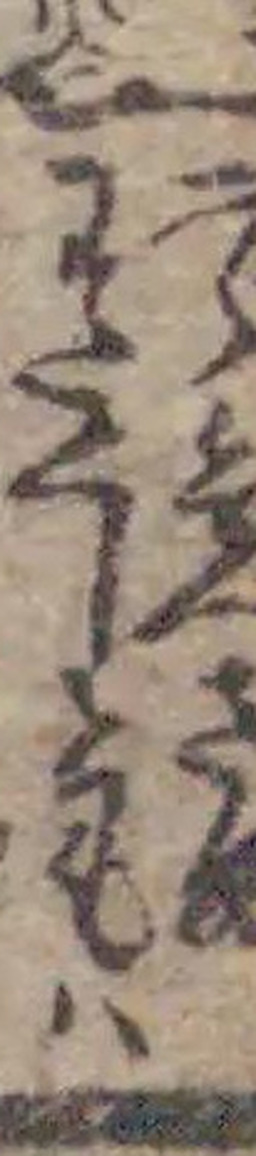わたくしともは
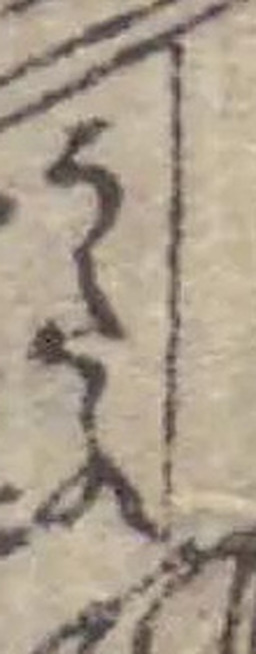うたふ
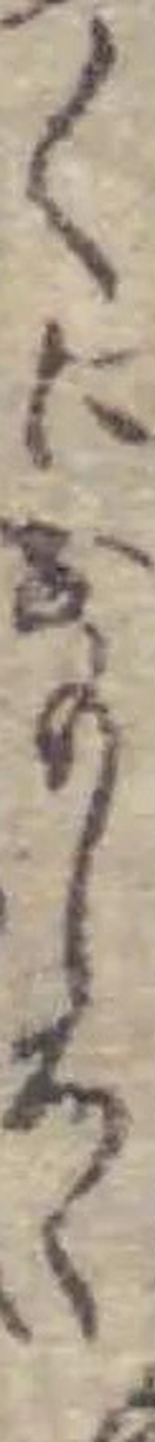〳〵におもしろく
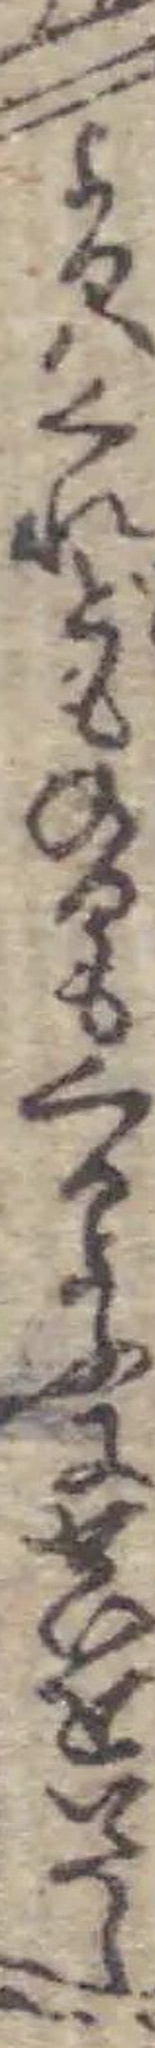よるはくれどもひるもくるよふにせいをいだし
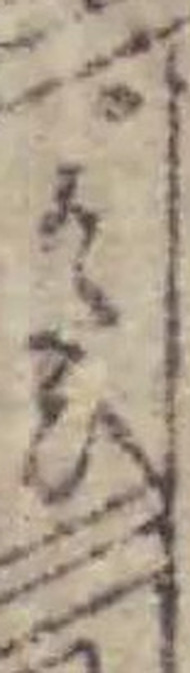うたひ
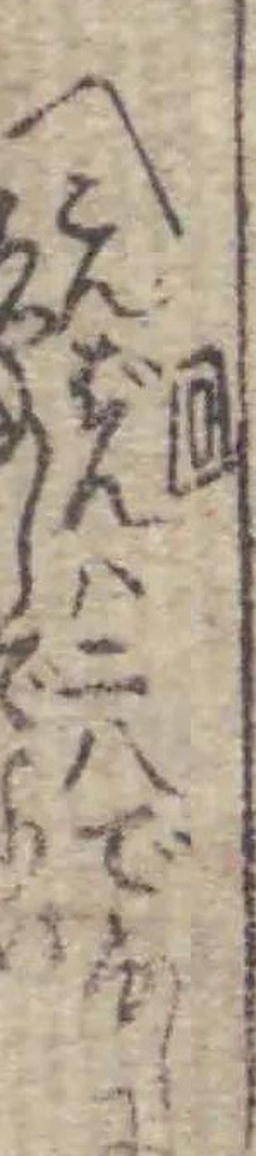「こんばんは二八でなしに
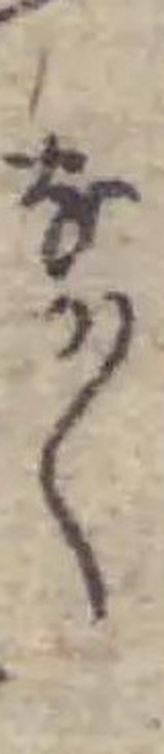なか〳〵
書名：津以曽無弟の甚六 3巻
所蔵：国立国会図書館 National Diet Library, JAPAN
